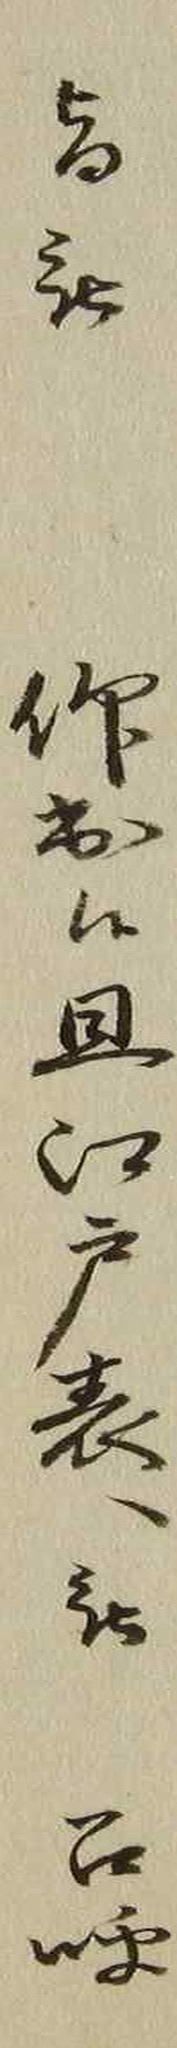旨被仰出候且江戸表へ被召呼
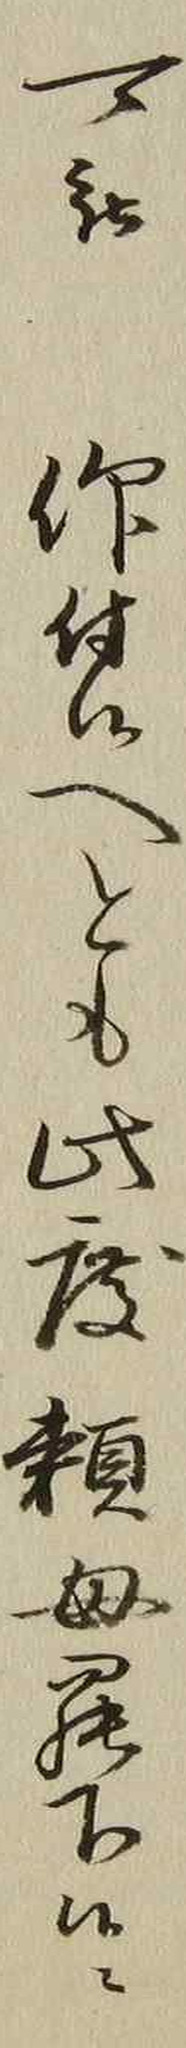可被仰付候へとも此度頼母罷下候に
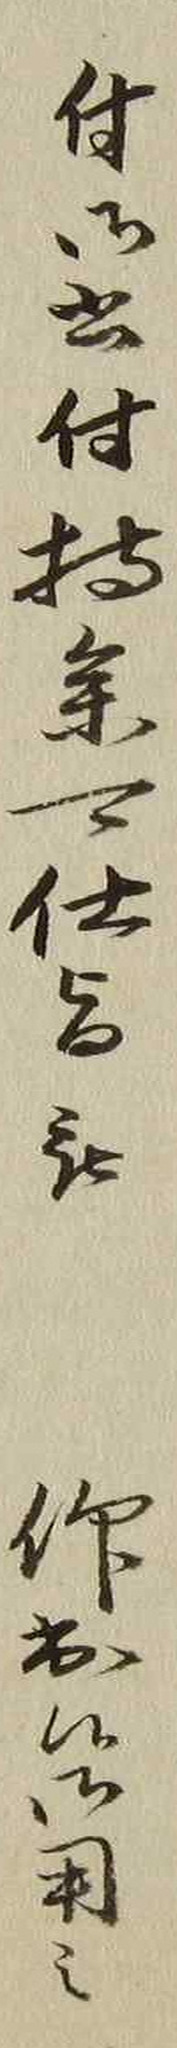付御書付持参可仕旨被仰出候御用之
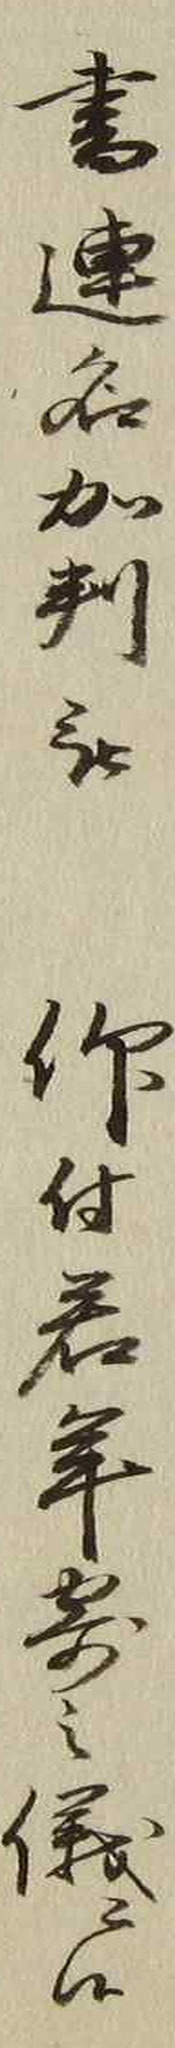書連名加判被仰付若年寄之儀に候
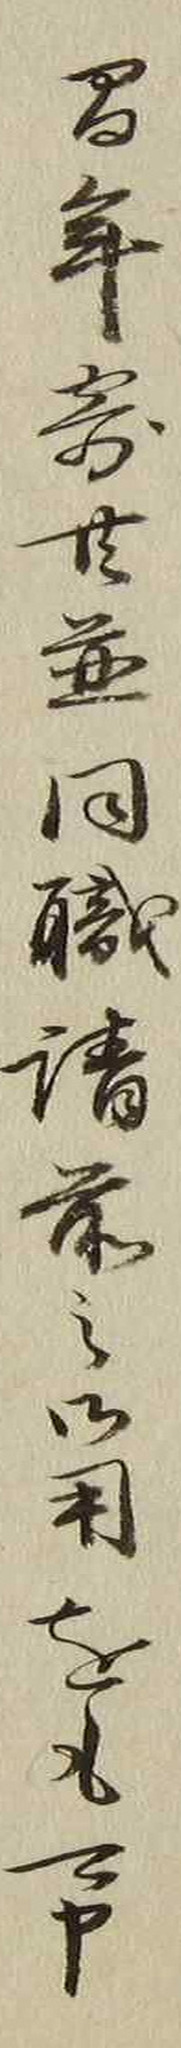間年寄共並同職請前之御用をも可申
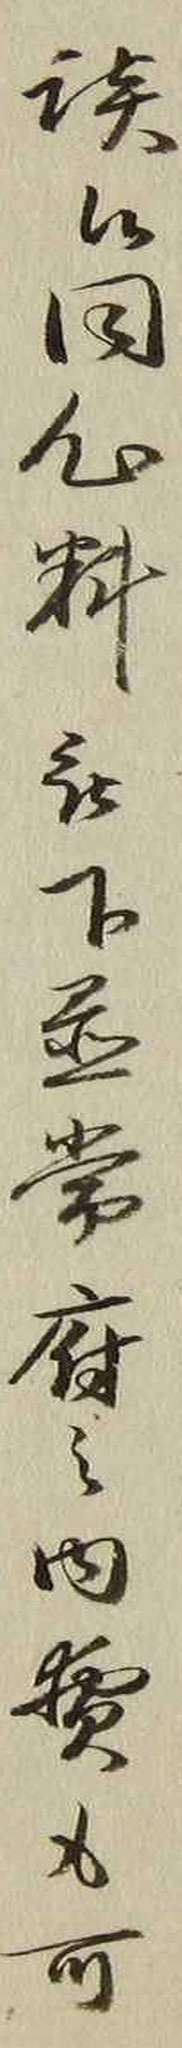談候同心料被下置常府之内費も可
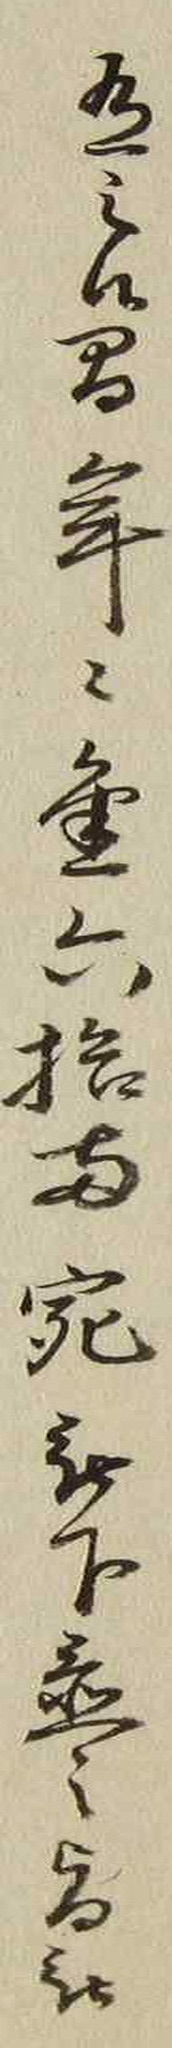有之候間年々金六拾両宛被下置之旨被
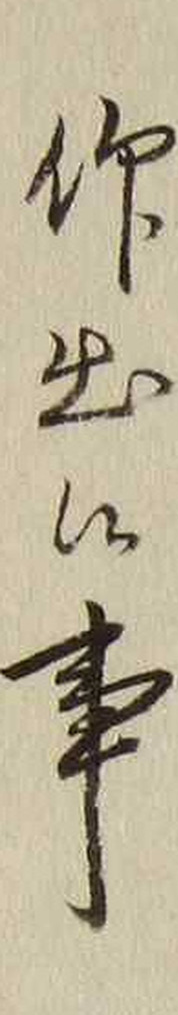仰出候事
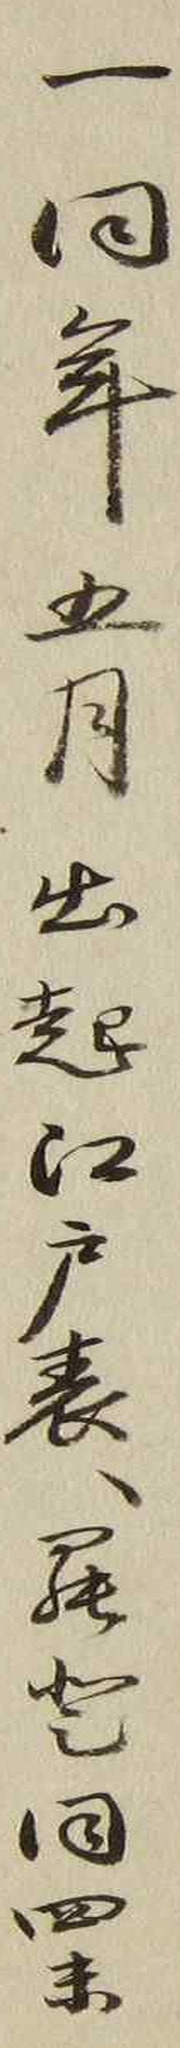一同年五月出起江戸表へ罷登同四末
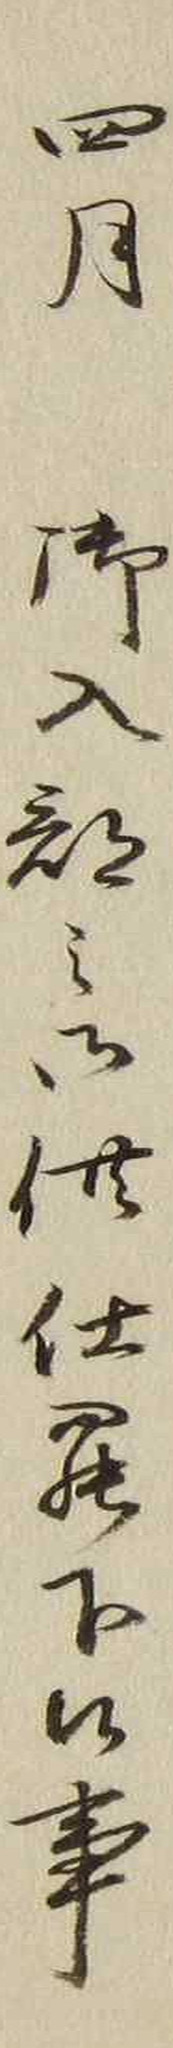四月御入部之御供仕罷下候事
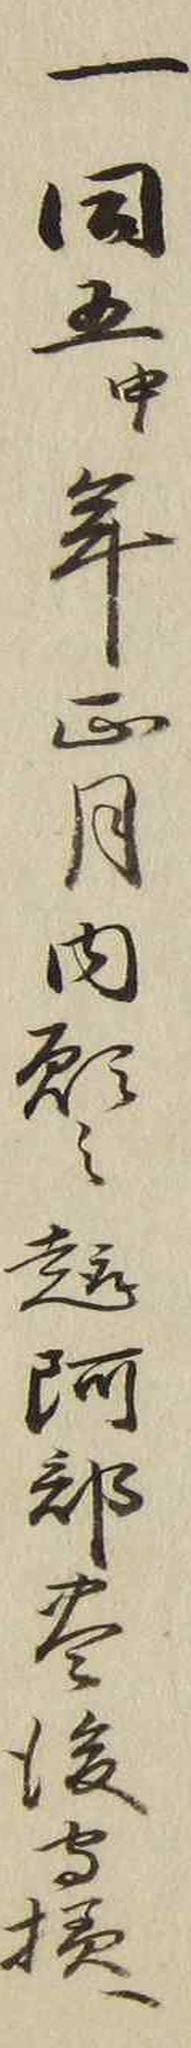一同五申年正月内願之趣阿部豊後守様へ

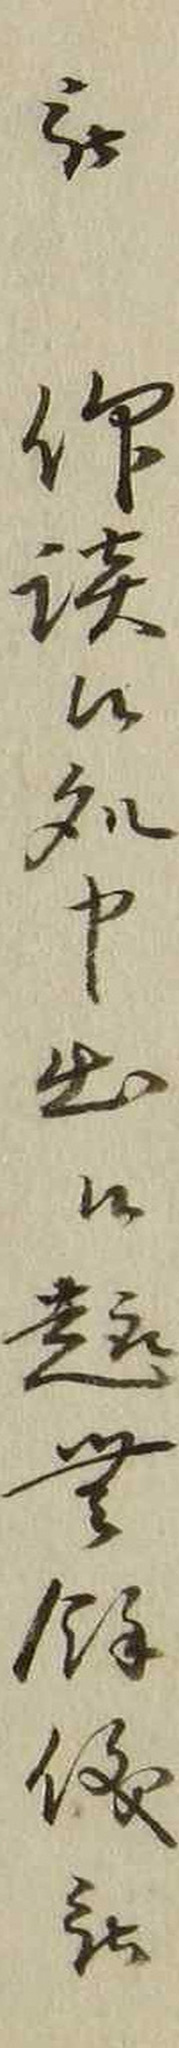被仰談候処申出候趣無余儀被
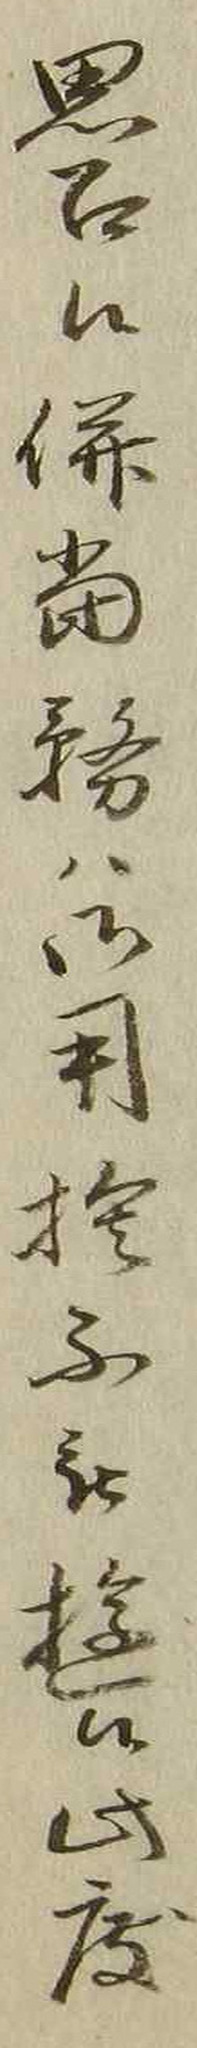思召候併当務は御用捨不被遊候此度
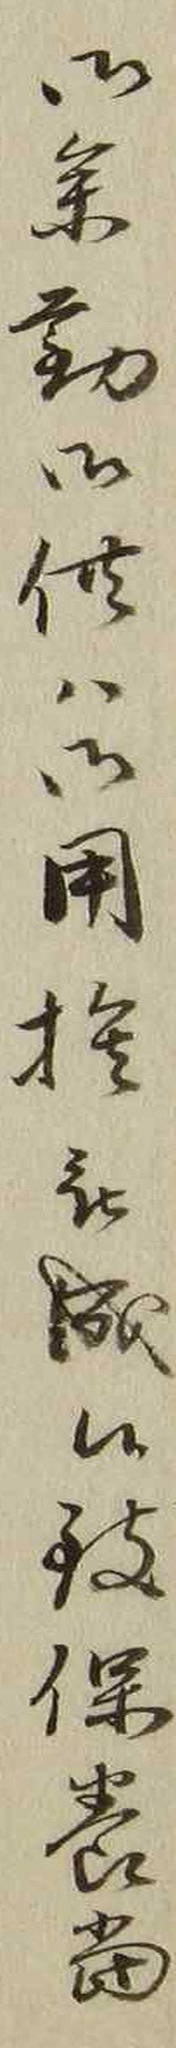御参動御供は御用捨被成候致保養当
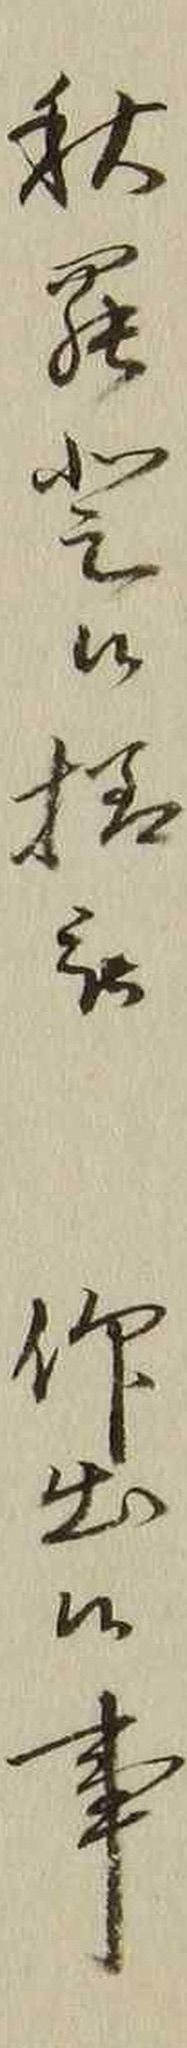秋罷登候様被仰出候事
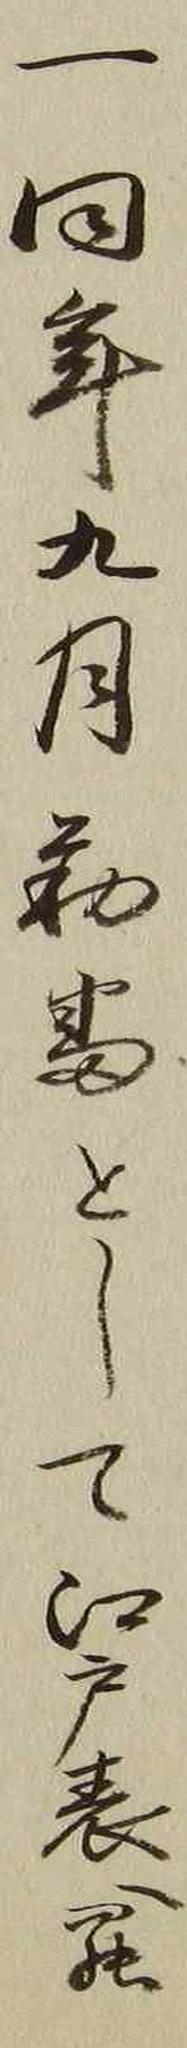一同年九月勤番として江戸表へ罷
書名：諸士系譜　巻之133　た之部9
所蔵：会津若松市立会津図書館
